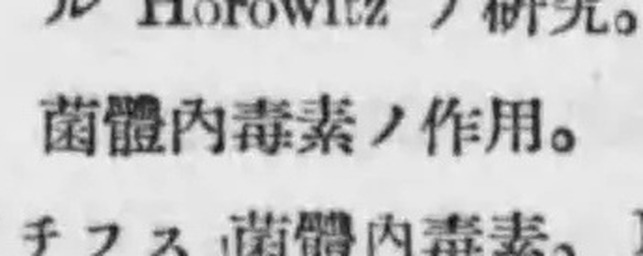菌体内毒素の作用。
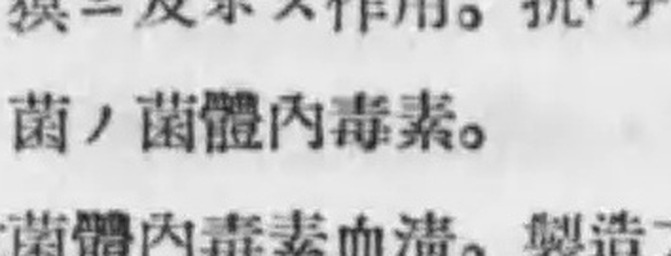菌の菌体内毒素。
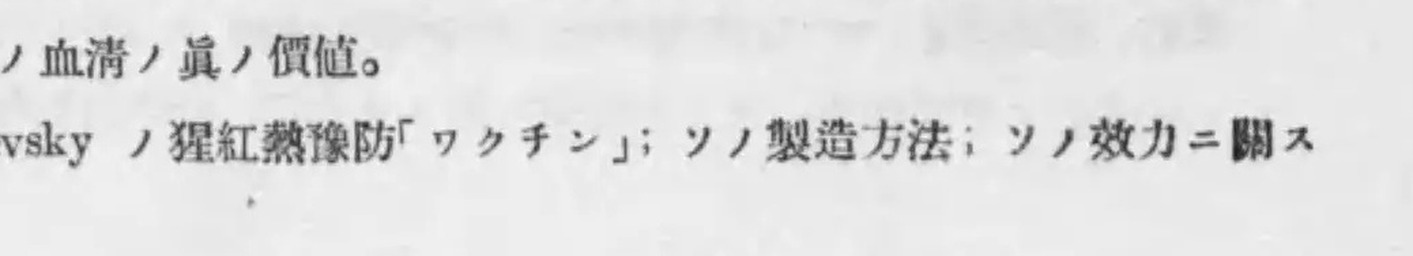の猩紅熱予防「ワクチン」;その製造方法;その効力に関す

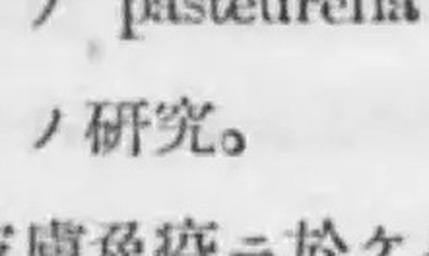の研究。
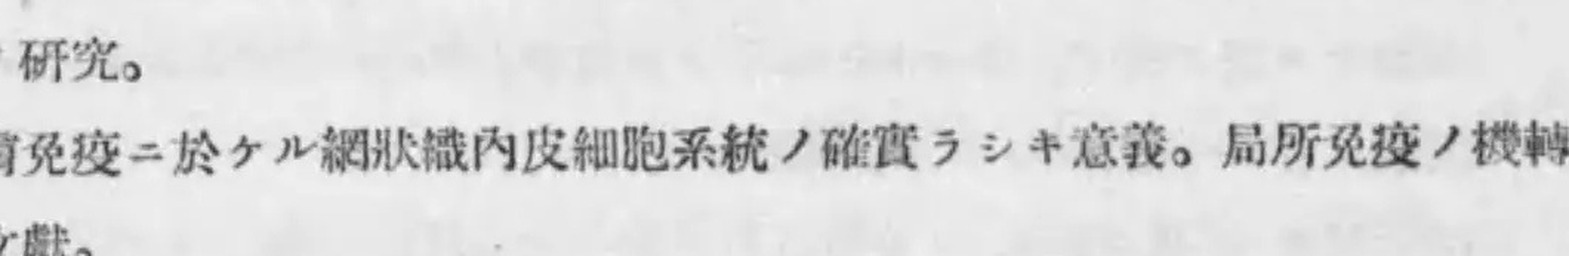皮膚免疫に於ける網状織内皮細胞系統の確実らしき意義。局所免疫の機転

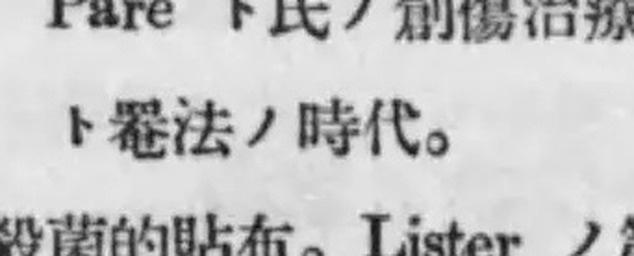と罨法の時代。
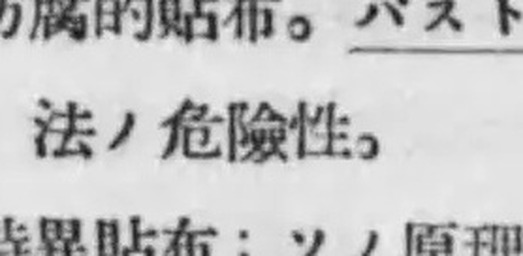法の危険性。

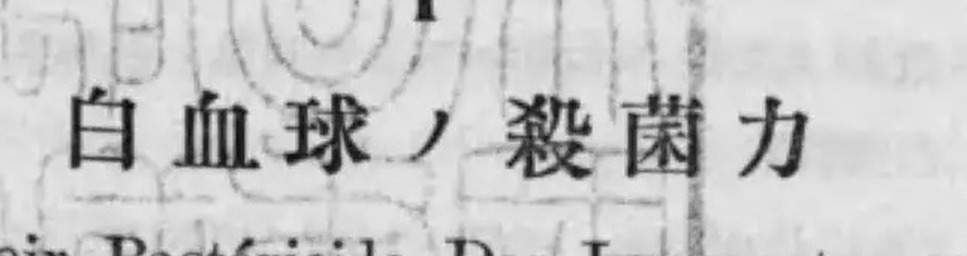白血球の殺菌力
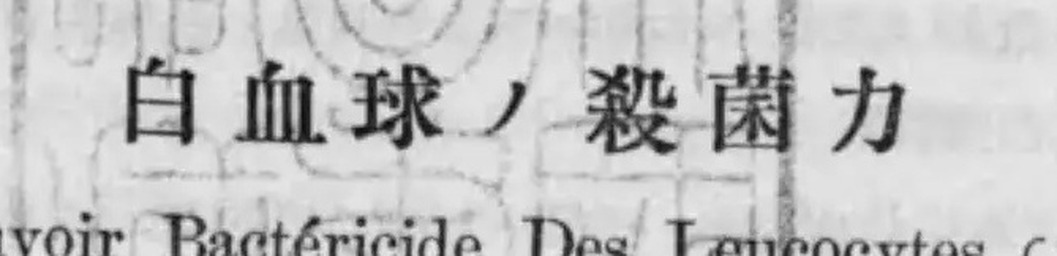白血球の殺菌力

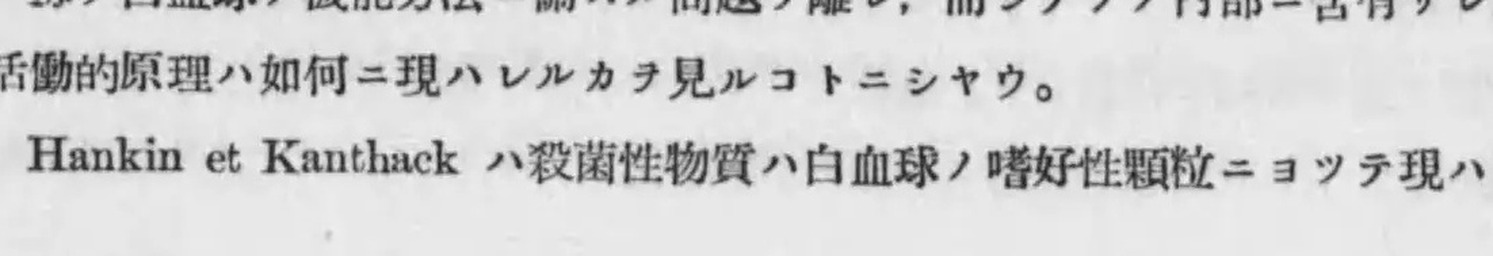は殺菌性物質は白血球の嗜好性顆粒によつて現はさ

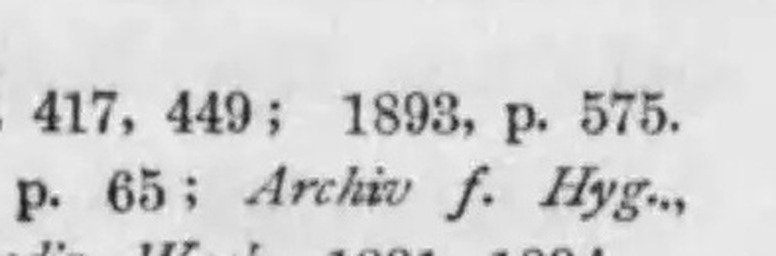,,,,,,,,;,,,
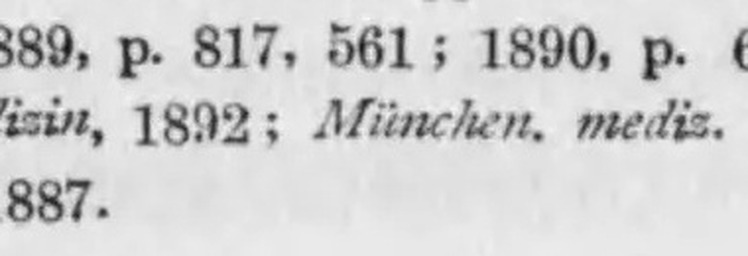,,,,,,,,;,,,
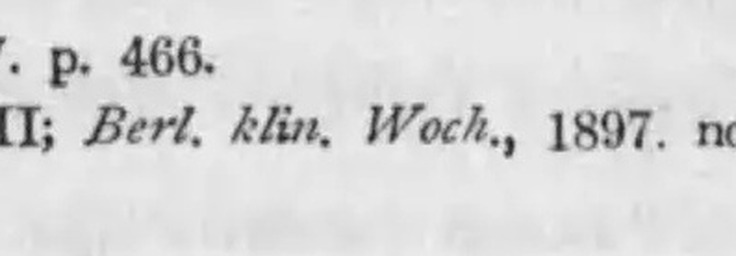,,,,,,,,;,,,
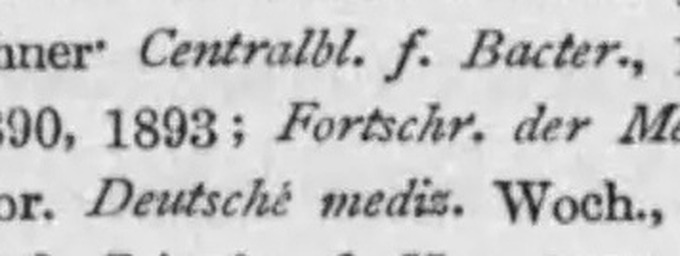,,,,,,,,;,,,

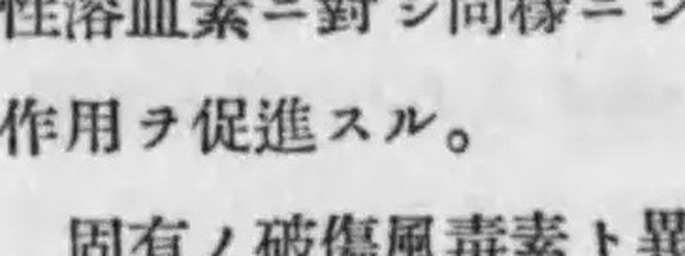作用を促進する。
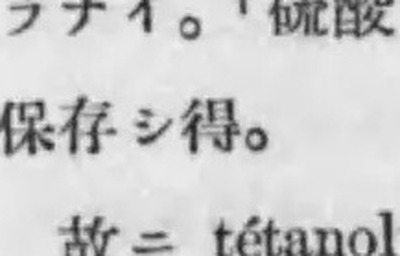保存し得。
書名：伝染病ニ於ケル免疫ニ関スル研究
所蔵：国立国会図書館 National Diet Library, JAPAN
